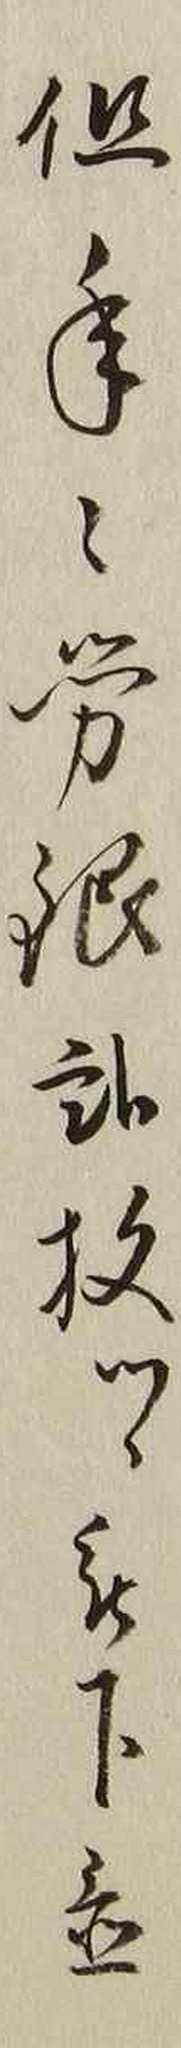但年々労銀弐枚ツヽ被下置
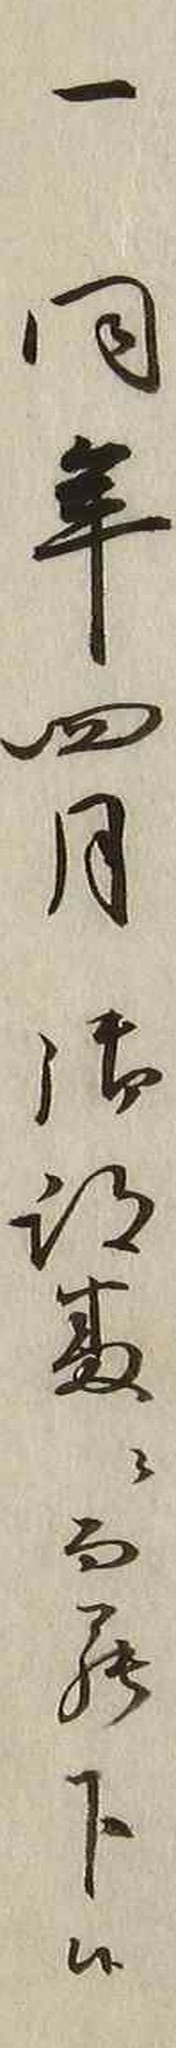一同年四月御跡番ニ而罷下候
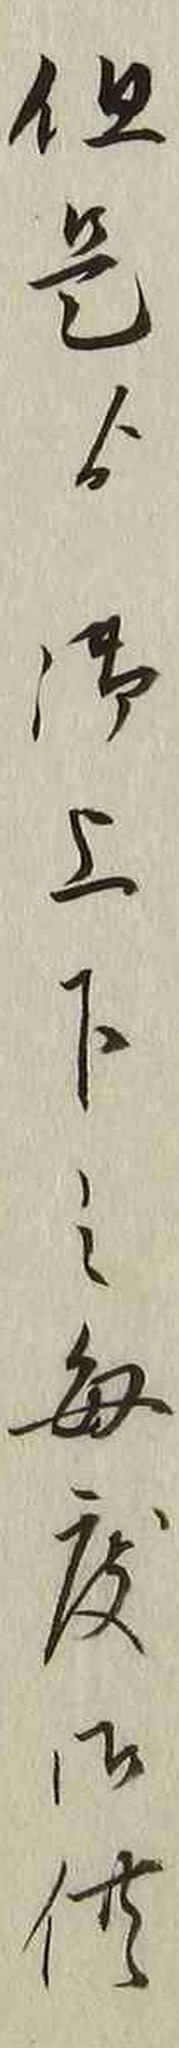但是ゟ御上下之毎度御供
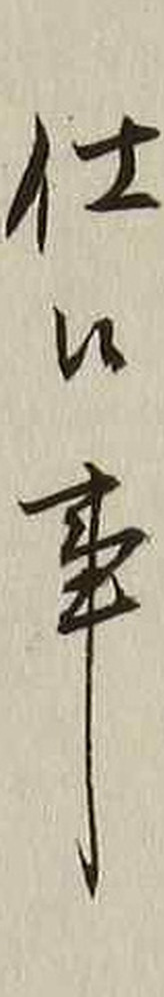仕候事
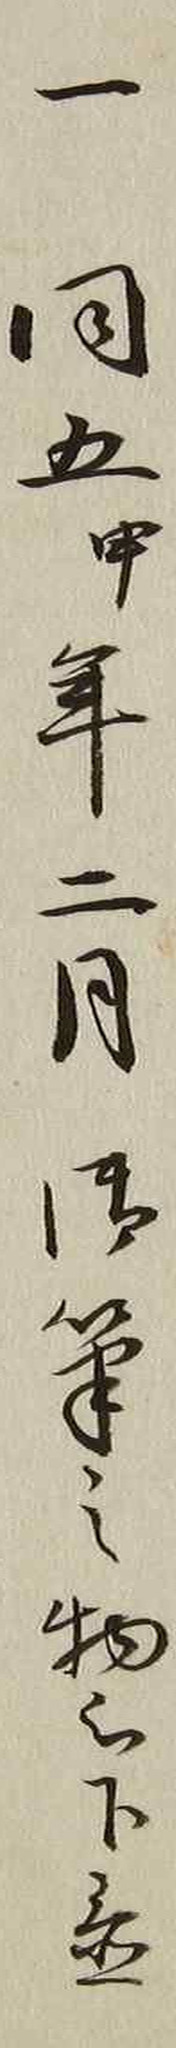一同五申年二月御筆之物被下置
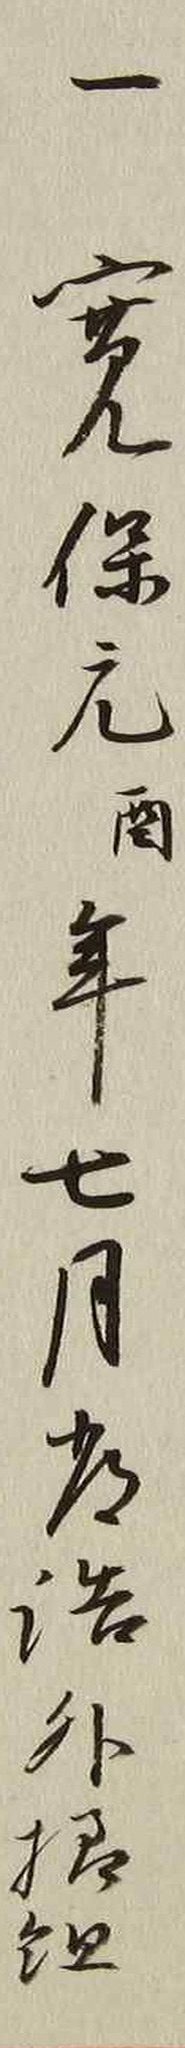一寛保元酉年七月常詰外様組
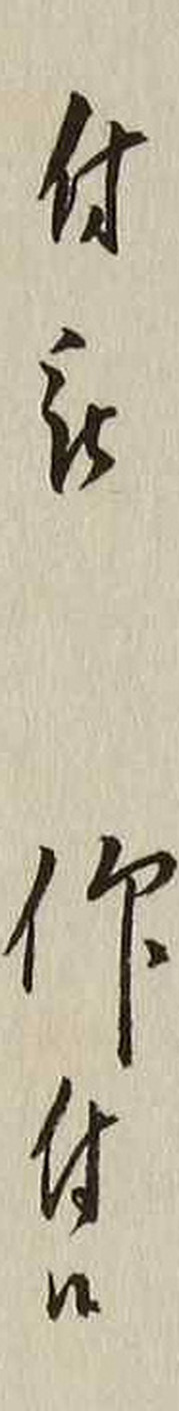付被仰付候
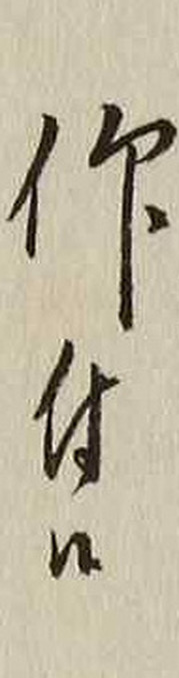仰付候
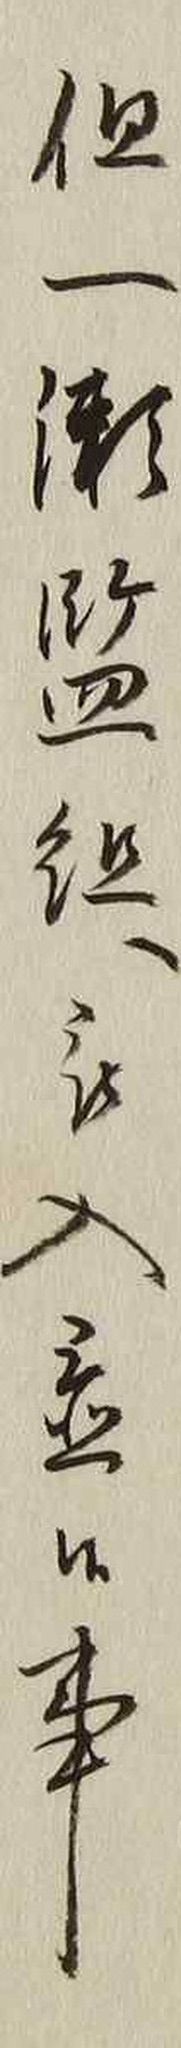但一瀬監組へ被入置候事
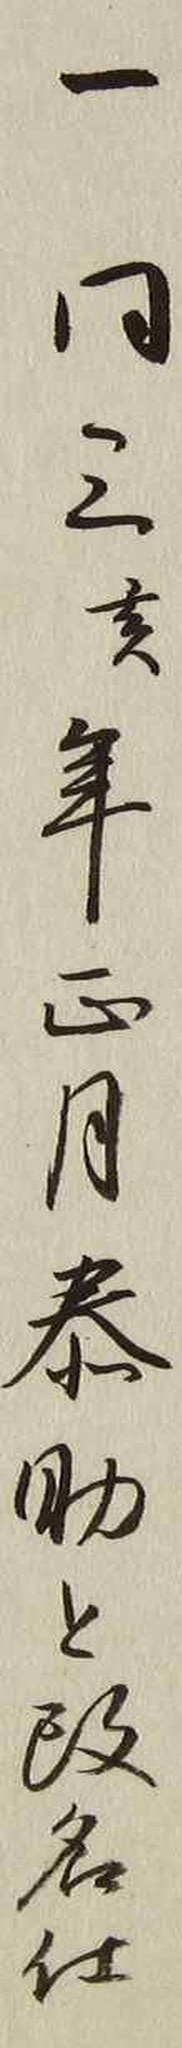一同三亥年正月泰助と改名仕
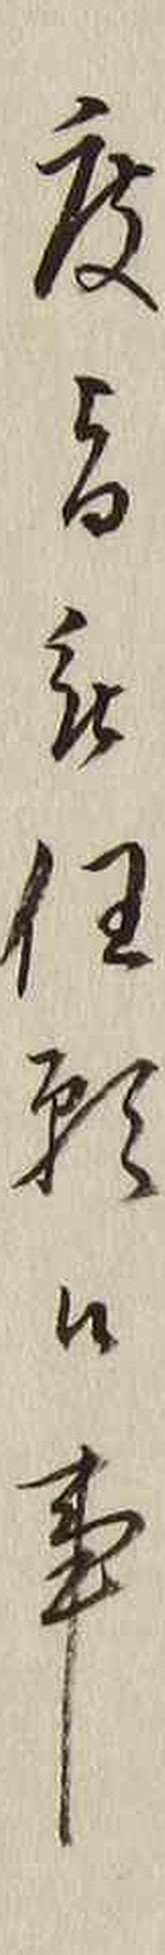度旨被任願候事
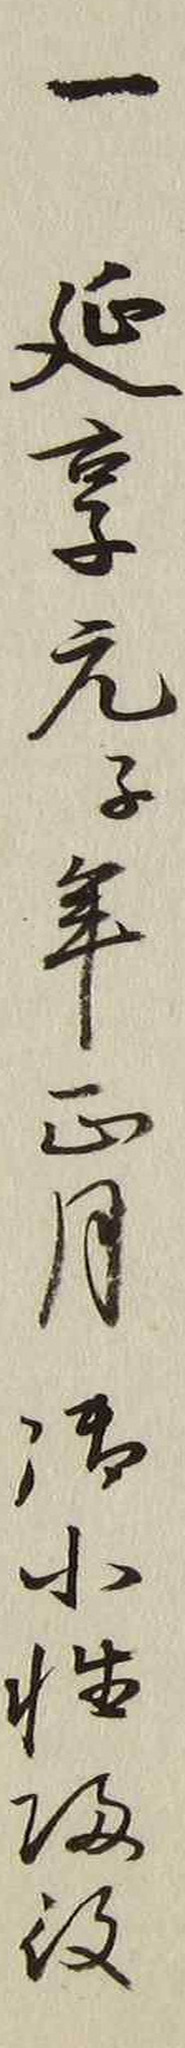一延享元子年正月御小性帰役
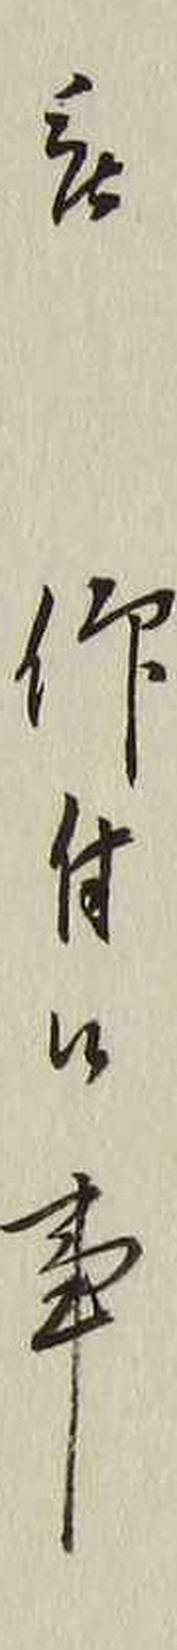被仰付候事
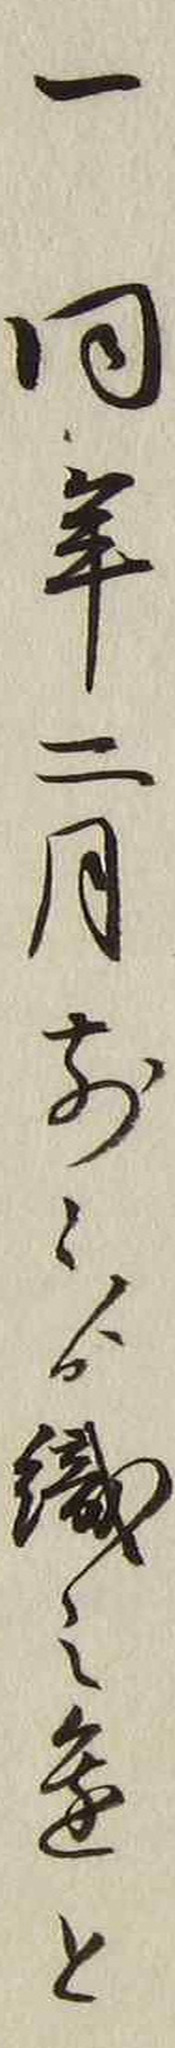一同年二月前々ゟ織之進と
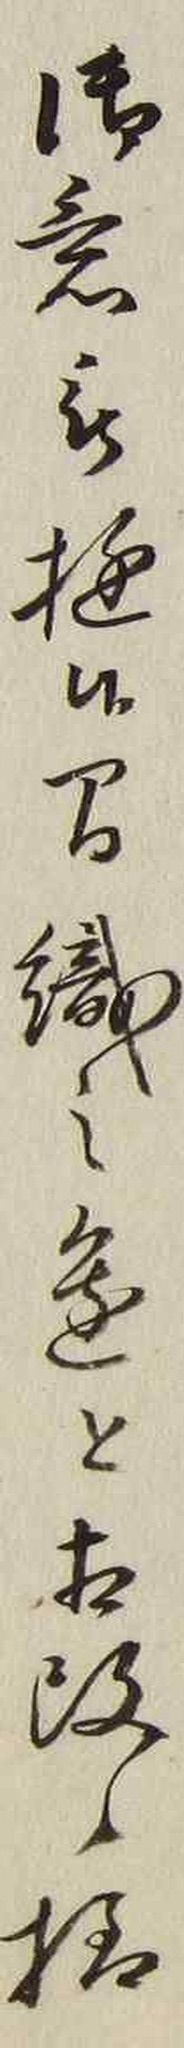御意被遊候間織之進と相改候様

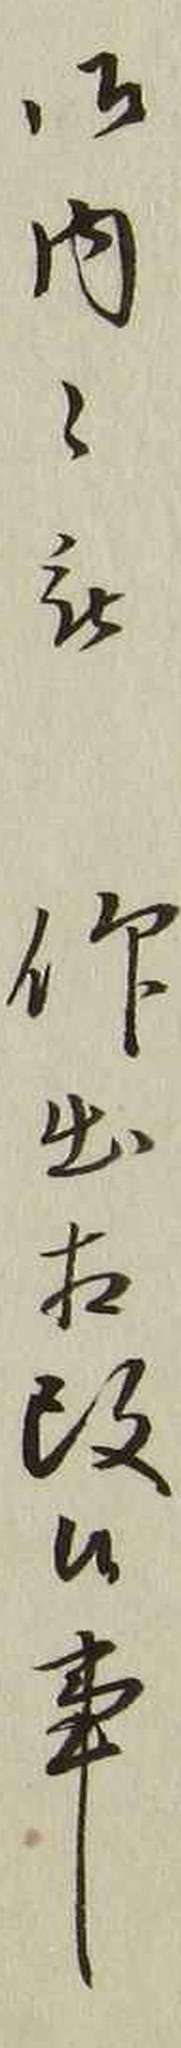御内々被仰出相改候事
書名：諸士系譜　巻之22　い之部22
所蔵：会津若松市立会津図書館
